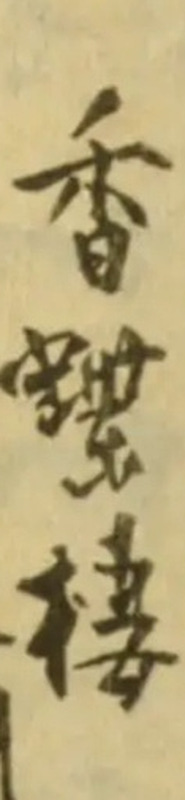香蝶楼
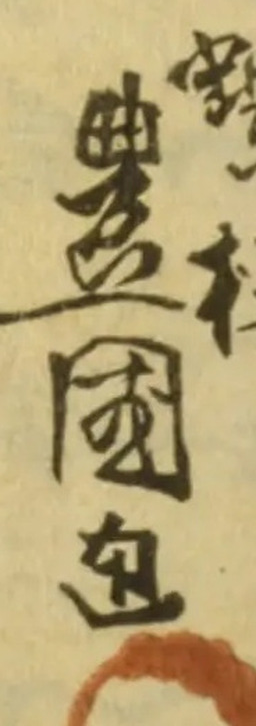豊国画
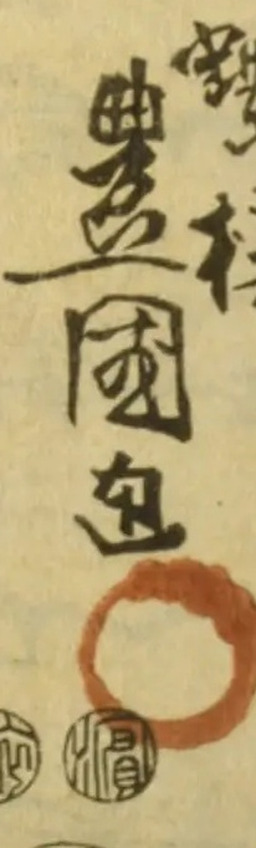豊国画
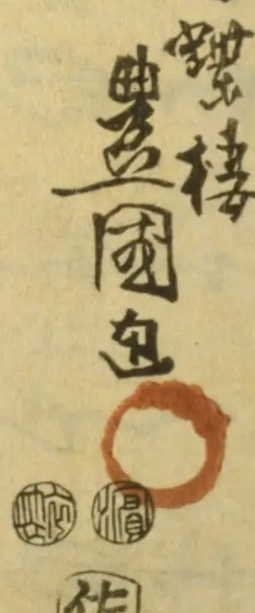豊国画
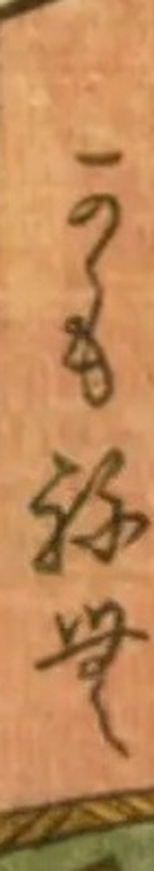かもねむ
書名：九拾壱番　後京極摂政前太政大臣
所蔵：国立国会図書館 National Diet Library, JAPAN
